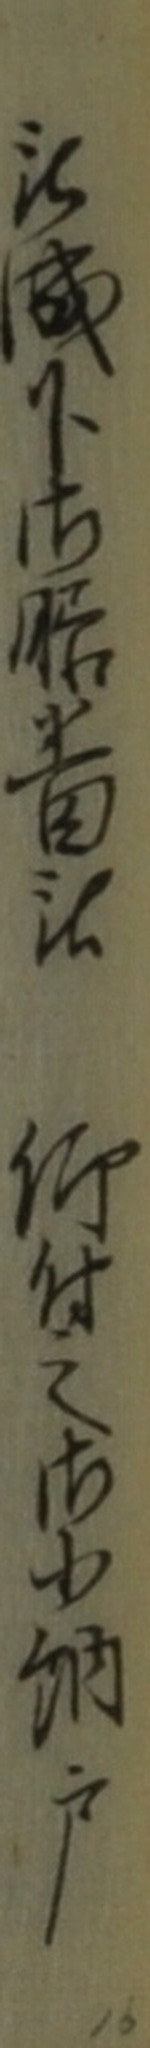被成下御膳番被仰付之御小納戸
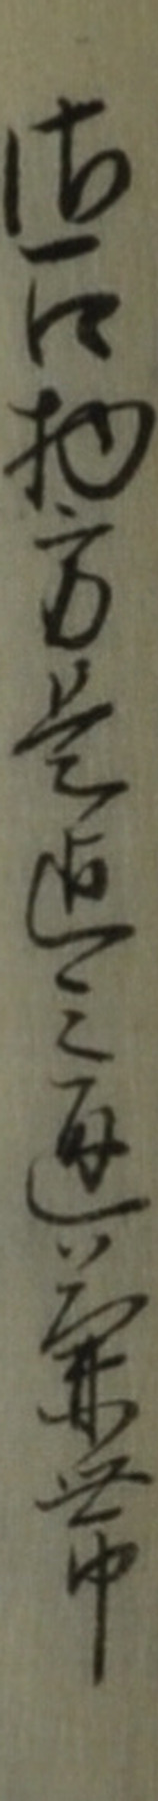御召物方是迄之通兼帯
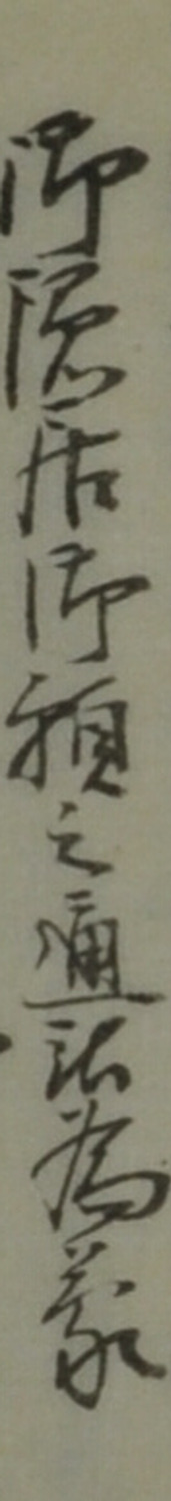御隠居御願之通被為蒙
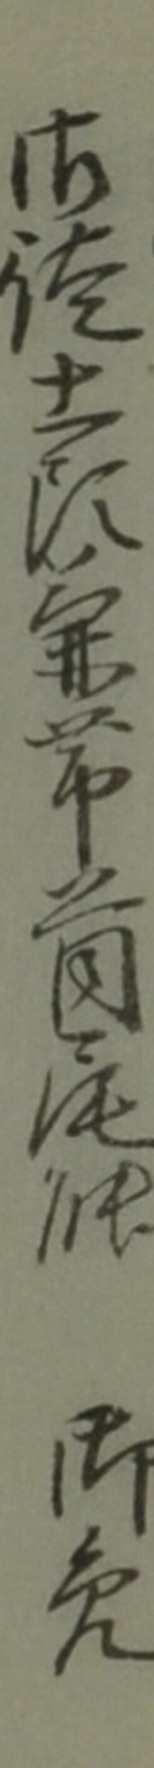御徒士頭兼帯首尾能御免
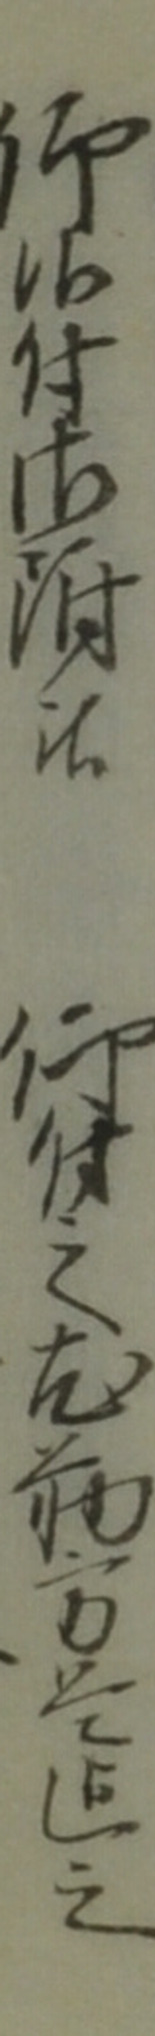仰候付御附被仰付之尤勤方是迄之
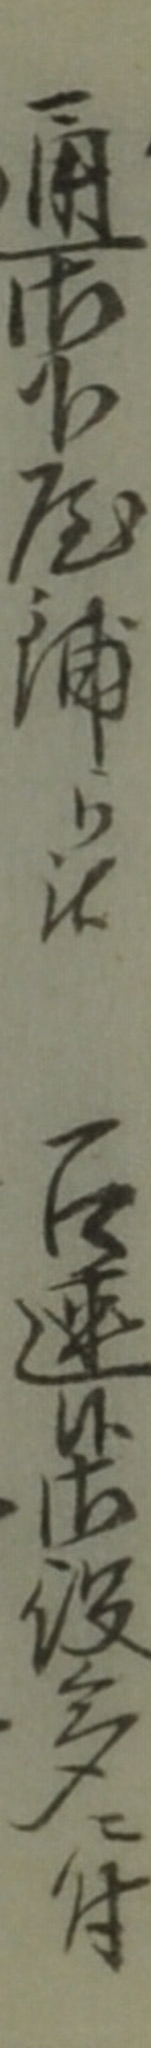通御下屋鋪江被召連候御役多ニ付
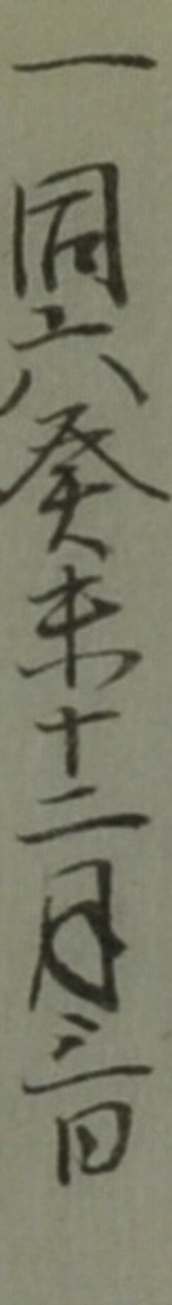一同六癸未十二月三日
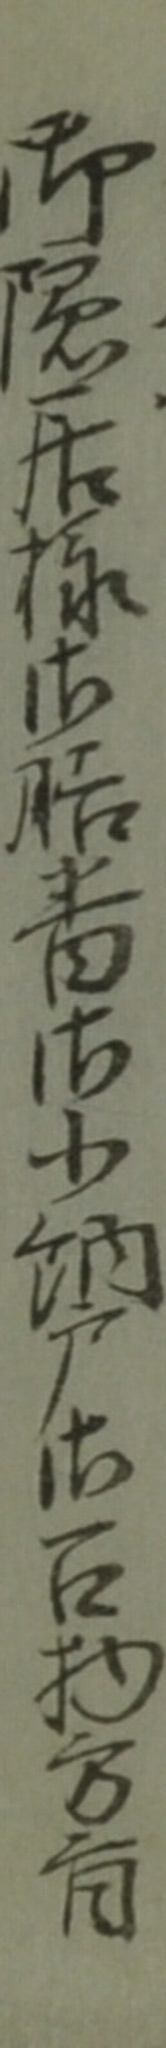御隠居様御膳番御小納戸御召物方首
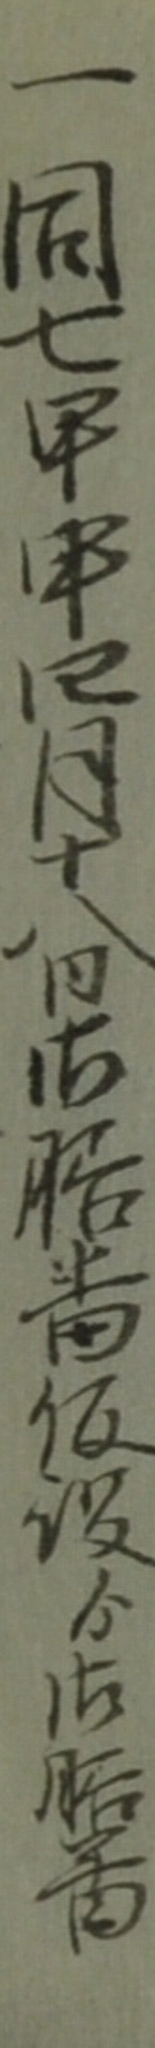一同七甲申四月十八日御膳番仮役ゟ御膳番
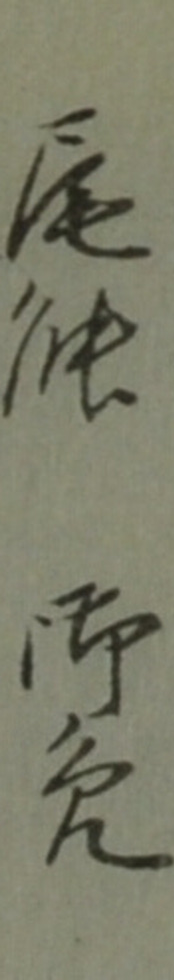尾能御免
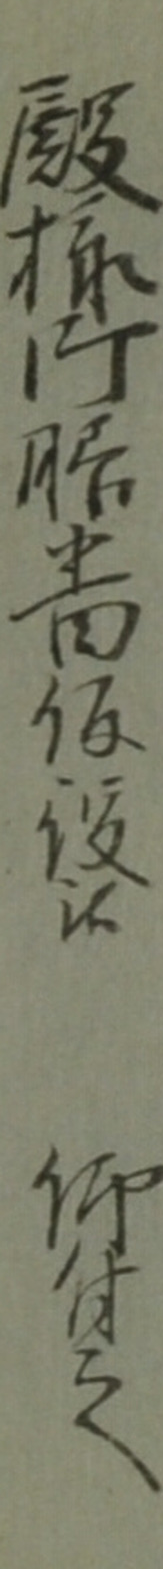殿様御膳番仮役被仰付之
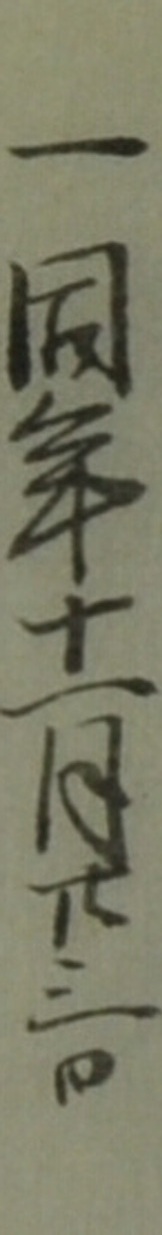一同年十一月廿三日
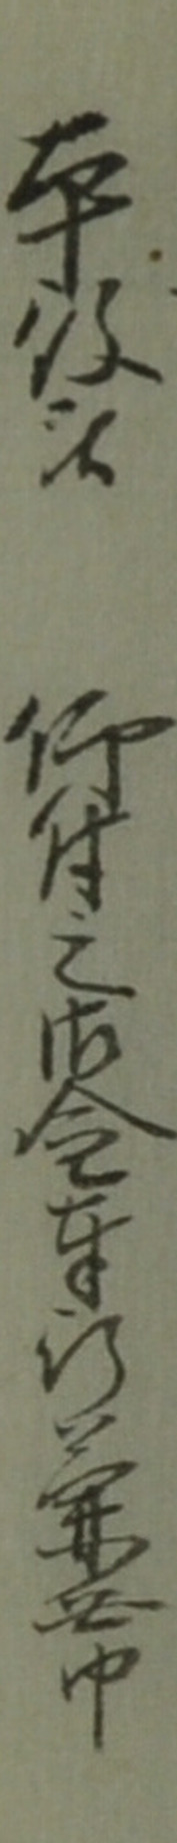本役被仰付之御金奉行兼帯
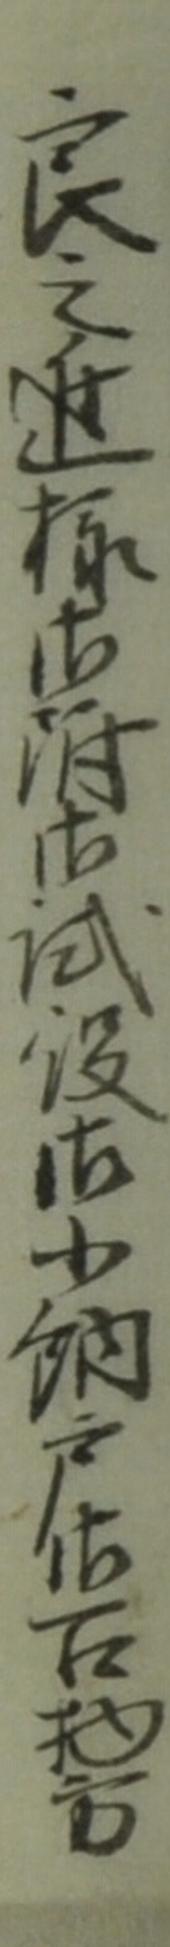良之進様御附御試役御小納戸御召物方

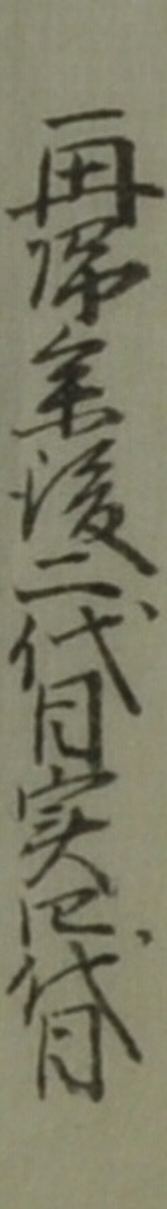再帰参後二代目実四代目
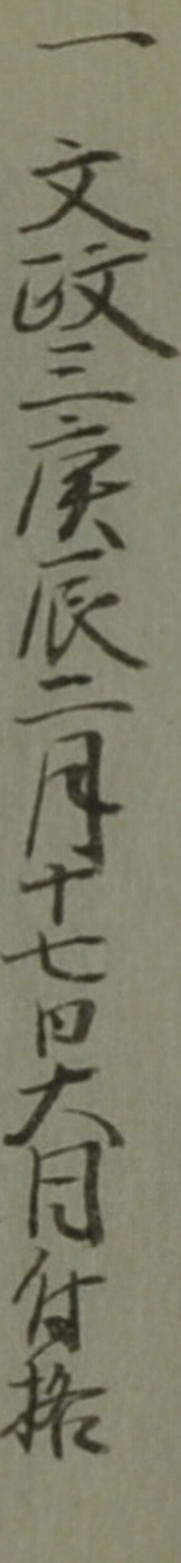一文政三庚辰二月十七日大目付格
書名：諸御役代々録（四）
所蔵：伊那市立高遠町図書館・合同会社AMANE
